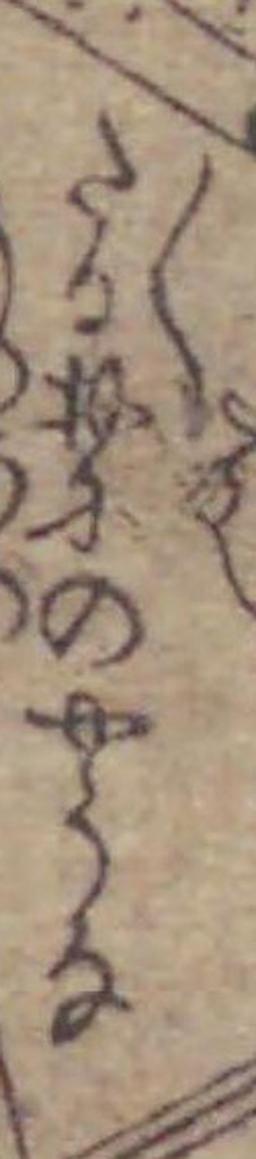たるおにのやうな
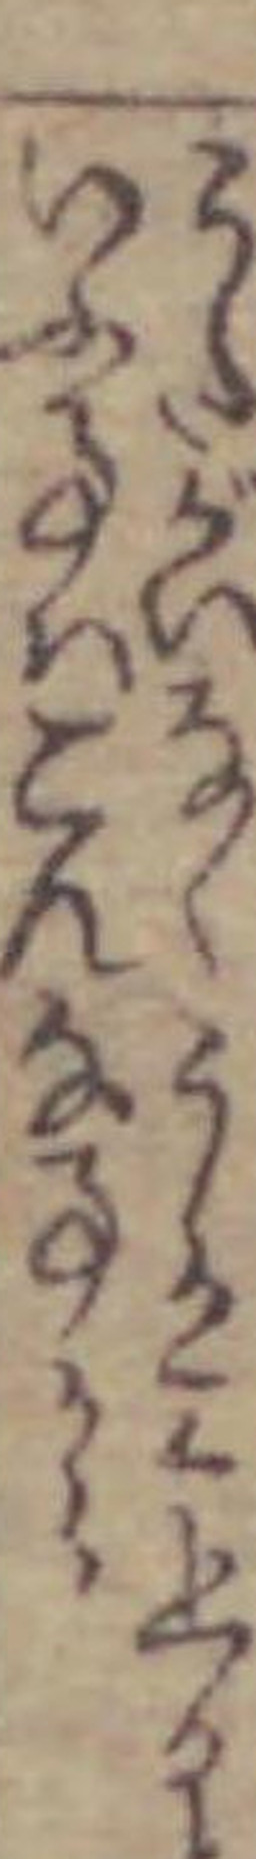いふ事はこんな事から
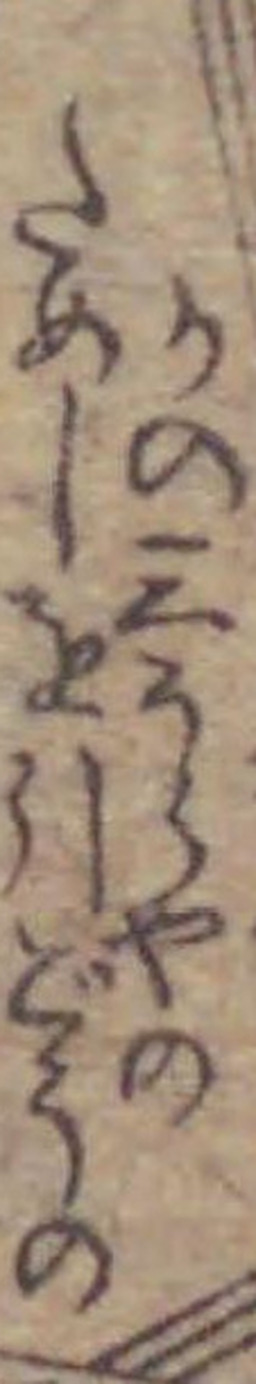ためしを引ごうの
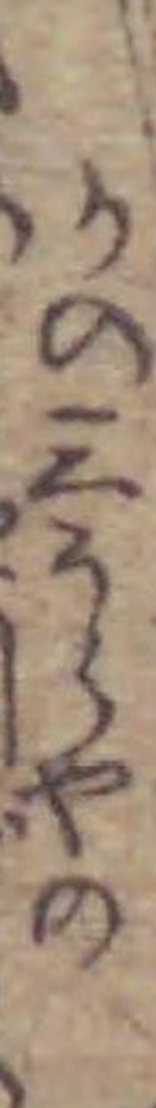かの三うらやの
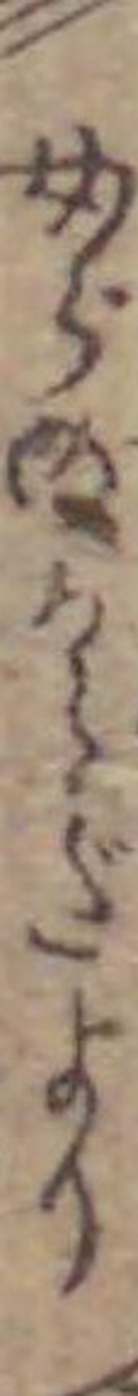女郎のからだより
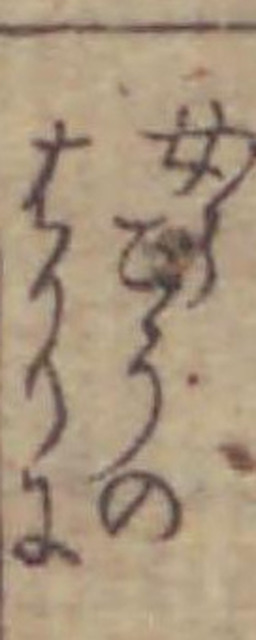はかりに
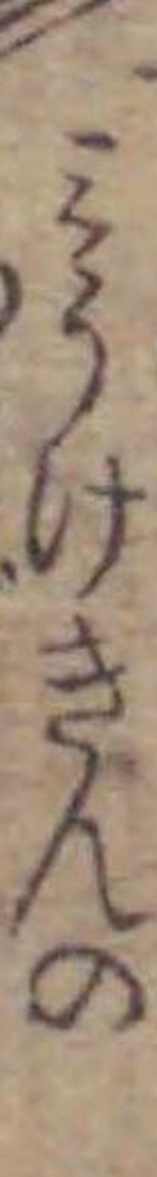みうけきんの
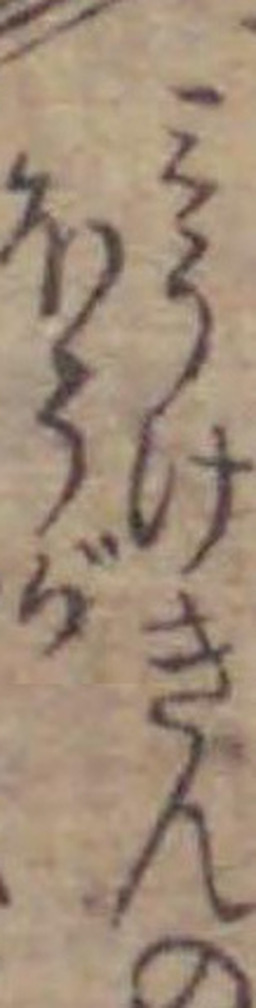ほうが
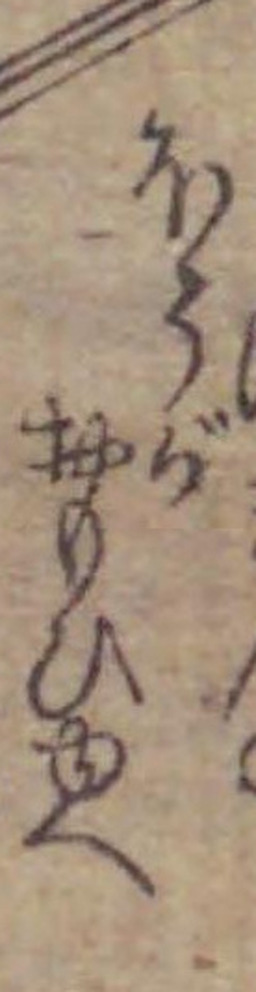おもひゆへ
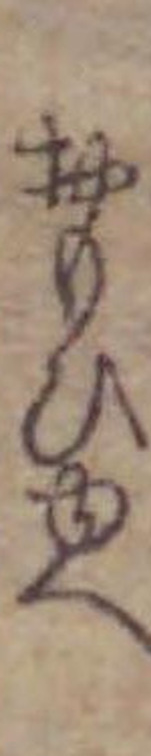おもひゆへ
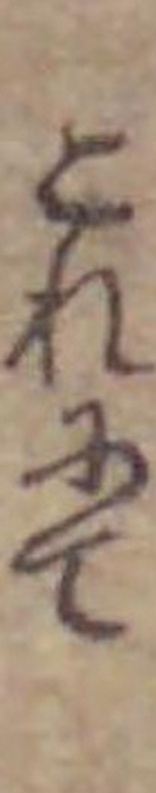これにて
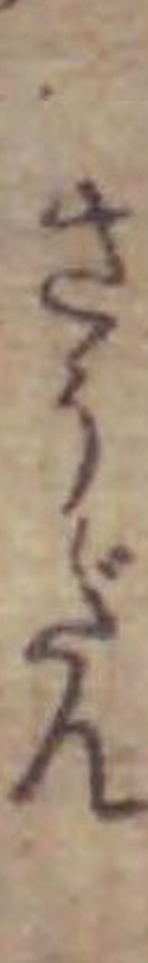さうだん
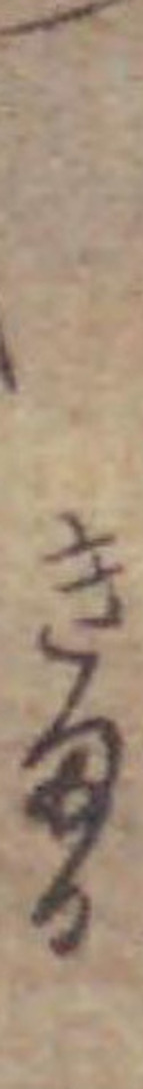きまる
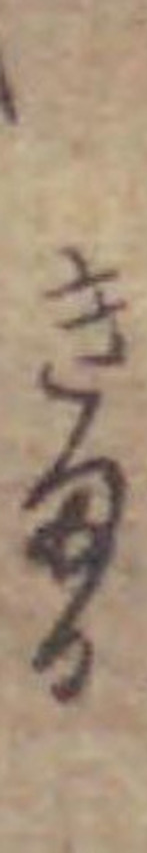きまる
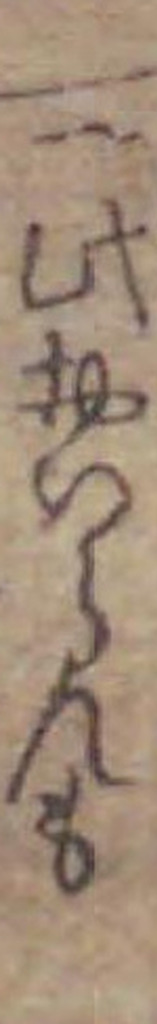「此おいらんも
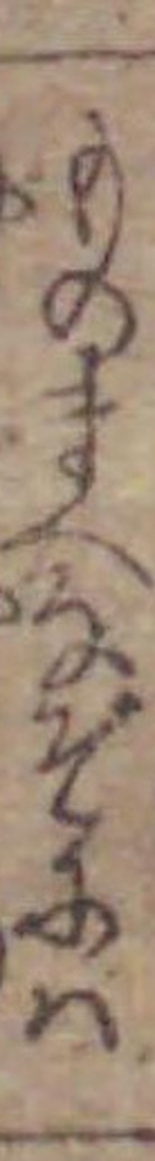ものまへなぞには
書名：九替十年色地獄 : 3巻
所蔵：国立国会図書館 National Diet Library, JAPAN
